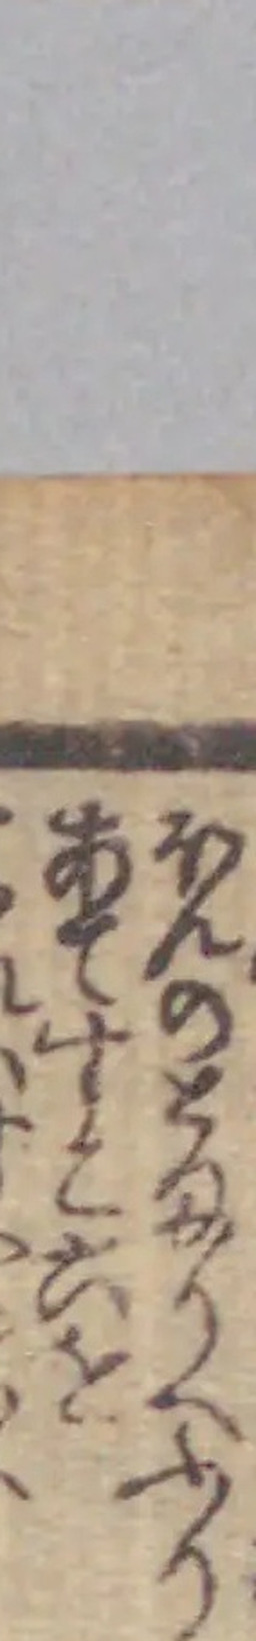あてすこ六を
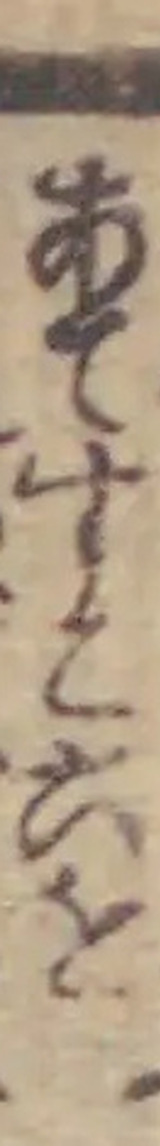あてすこ六を
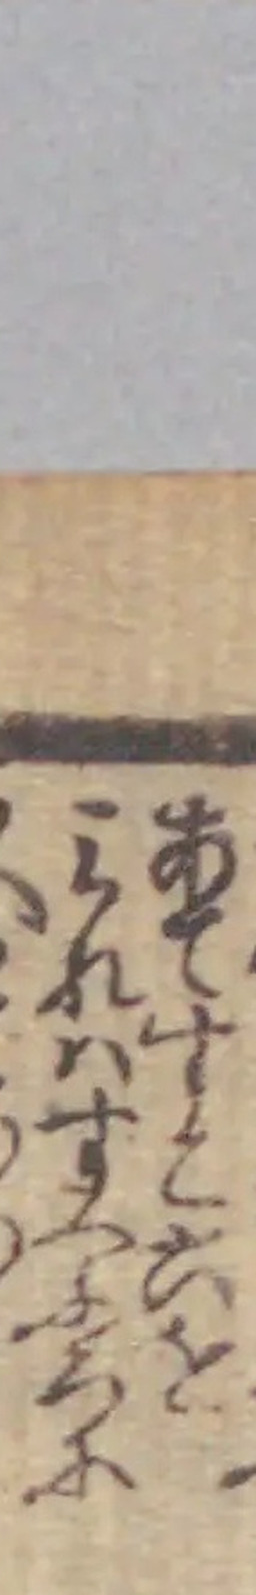みれはすへふろに
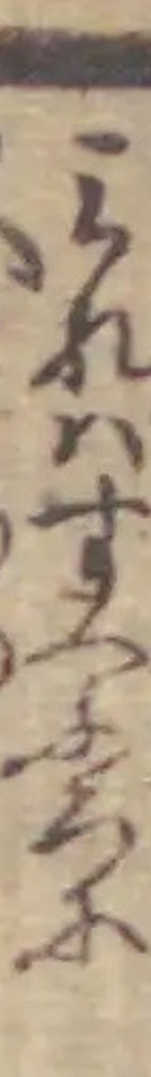みれはすへふろに
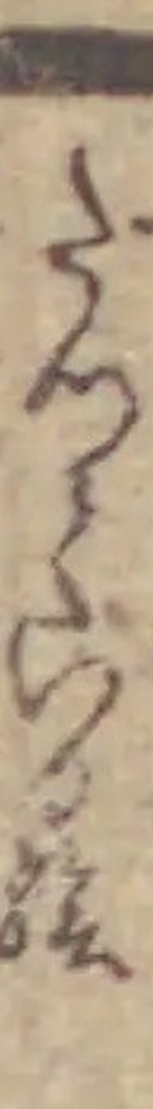たつている絵
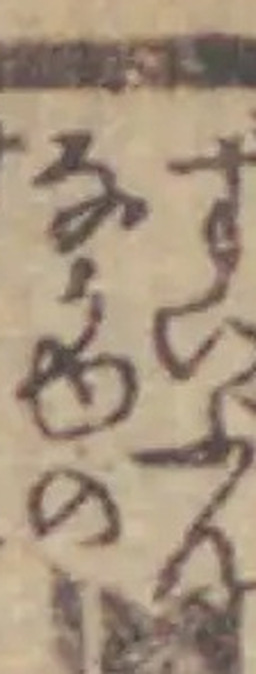なかゆの
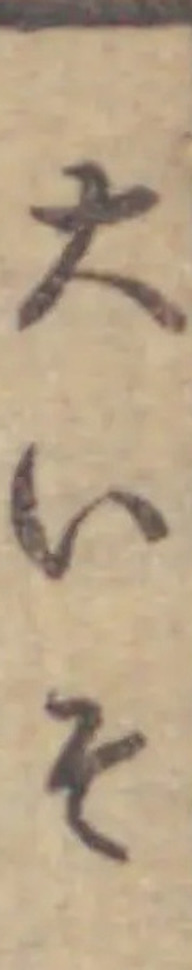大いそ
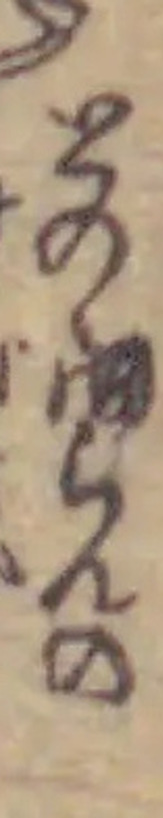との御らんの
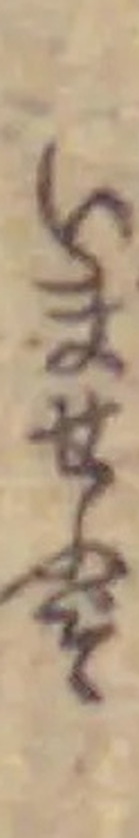いませふぞ
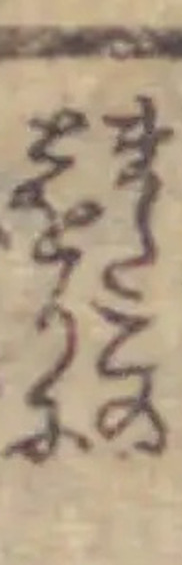とおりに
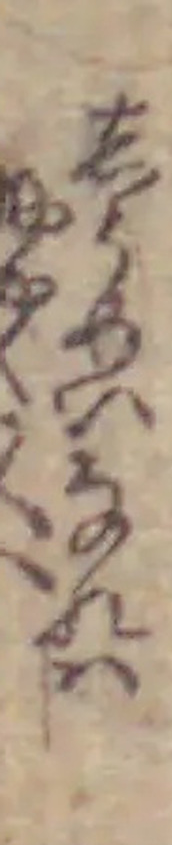しうめいなれは
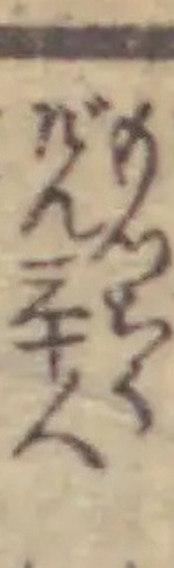げん三十人
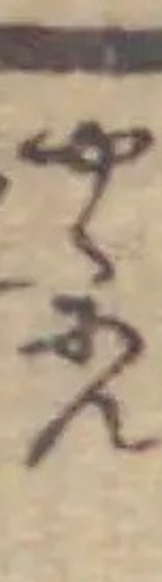やくにん
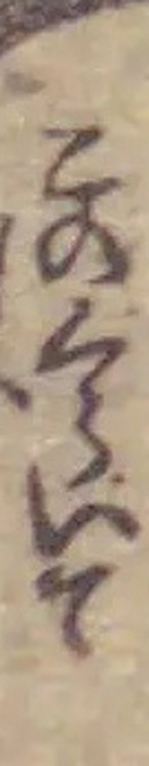このくらいて
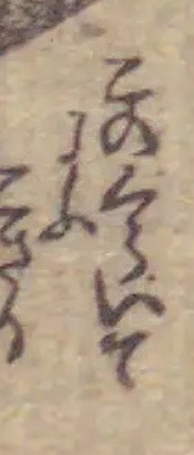このくらいて
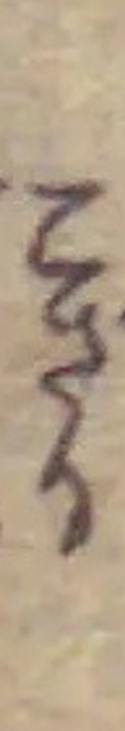こさり
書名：道笑双六
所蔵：国立国会図書館 National Diet Library, JAPAN
